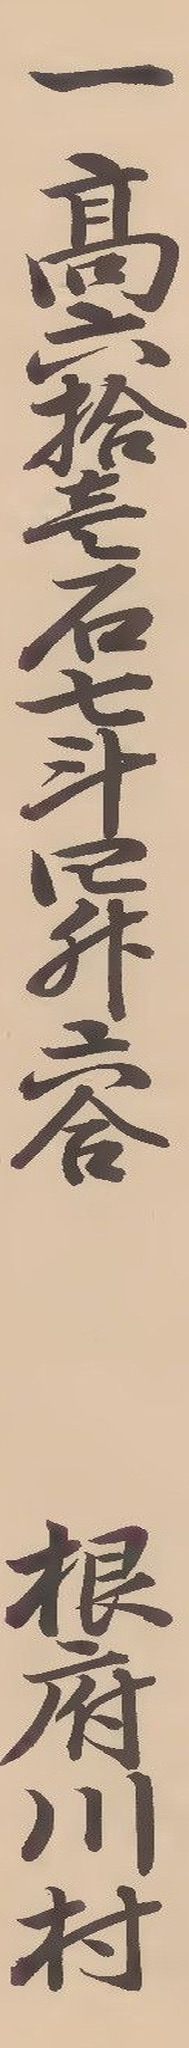一高六拾壱石七斗四升六合根府川村
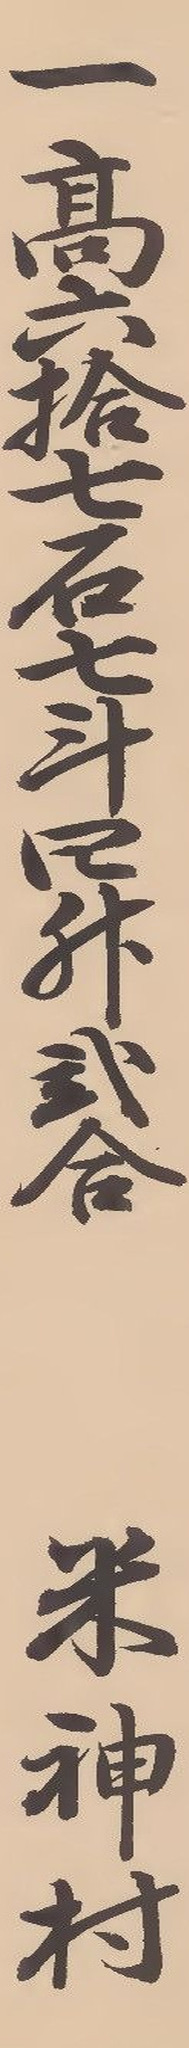一高六拾七石七斗四升弐合米神村
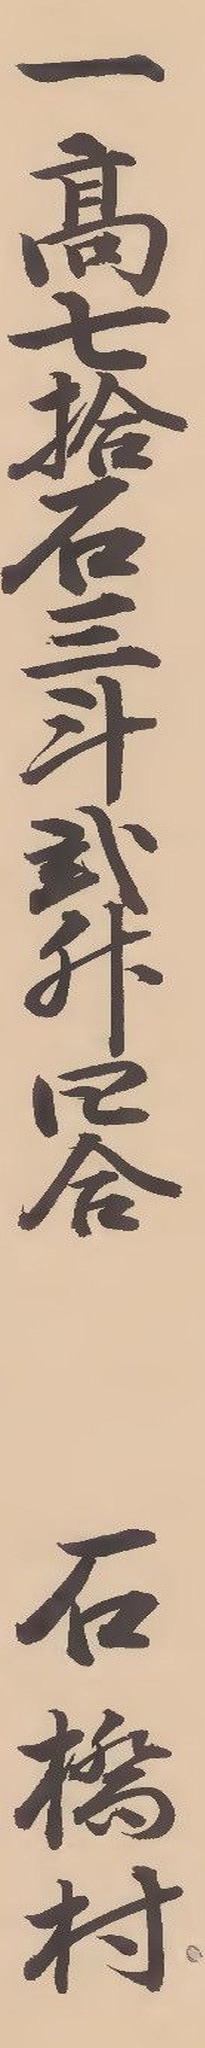一高七拾石三斗弐升四合石橋村
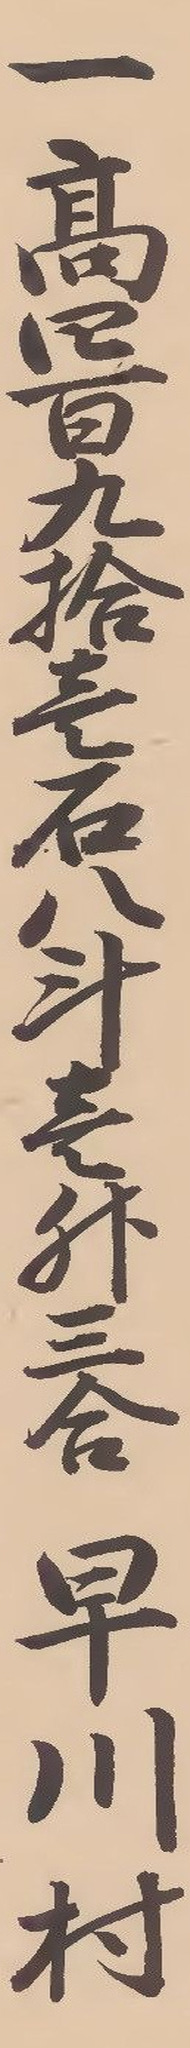一高四百九拾壱石八斗壱升三合早川村
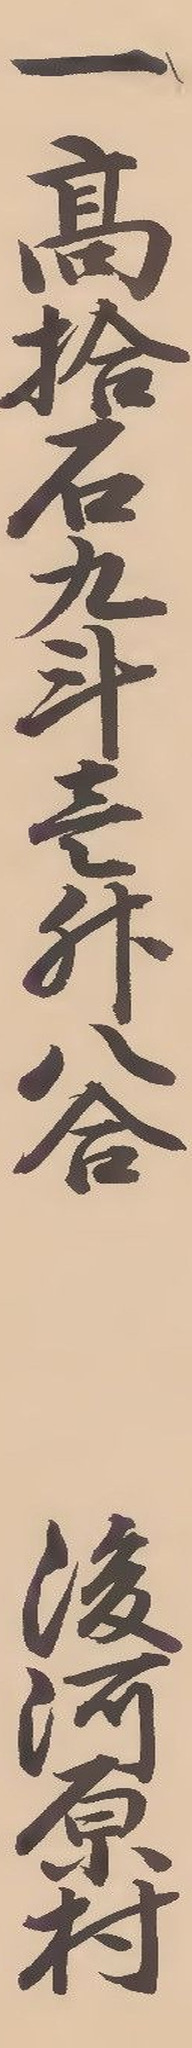一高拾石九斗壱升八合後河原村

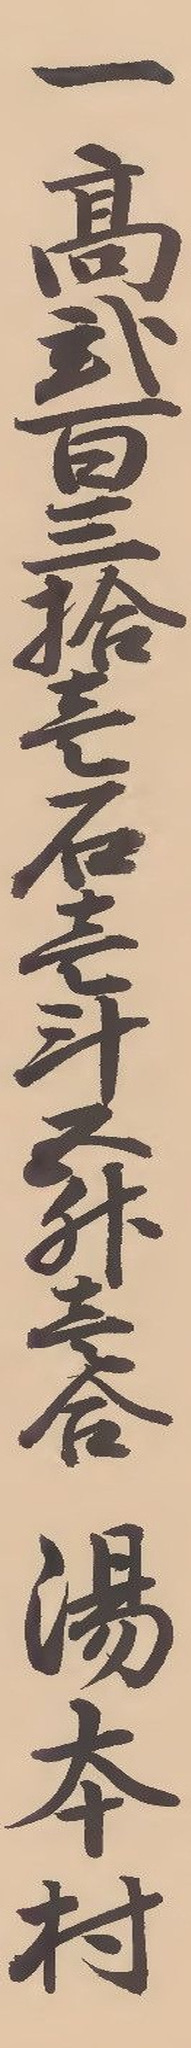一高弐百三拾壱石壱斗五升壱合湯本村
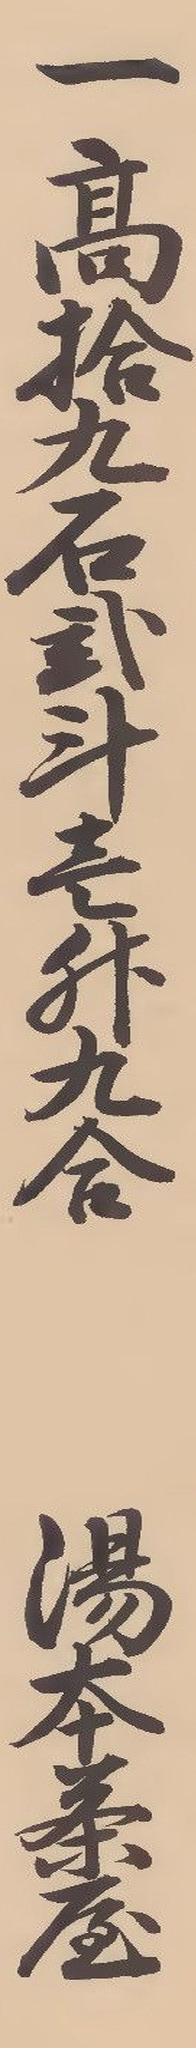一高拾九石弐斗壱升九合湯本茶屋
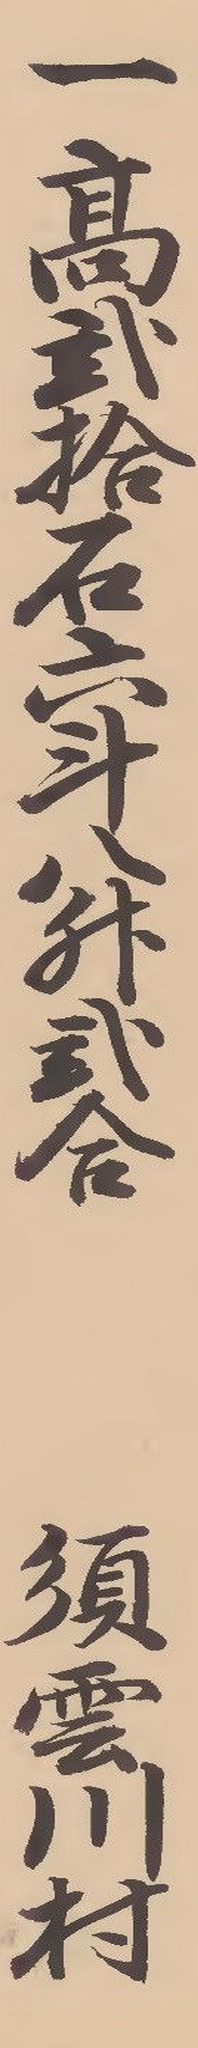一高弐拾石六斗八升弐合須雲川村
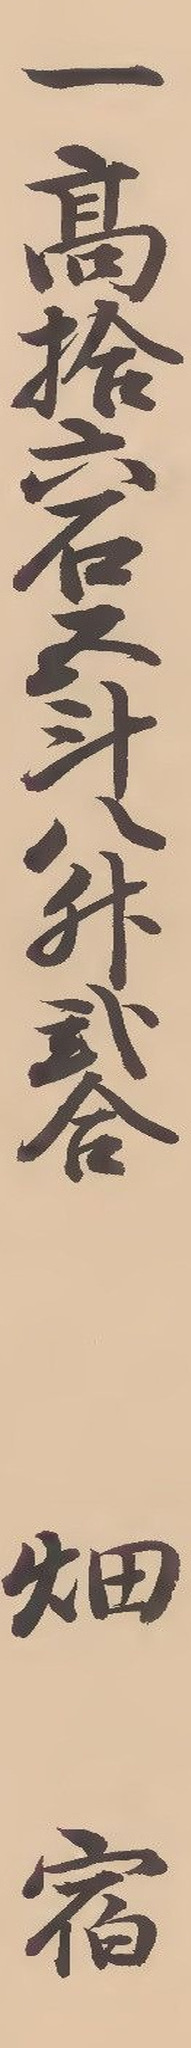一高拾六石五斗八升弐合畑宿
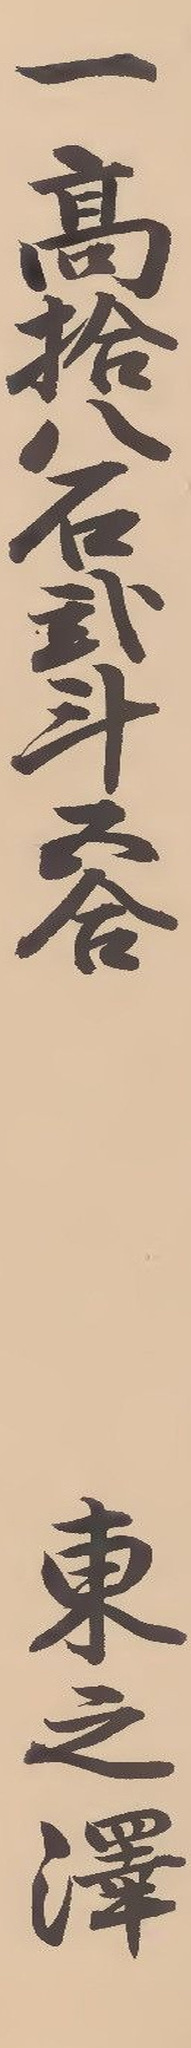一高拾八石弐斗五合東之澤
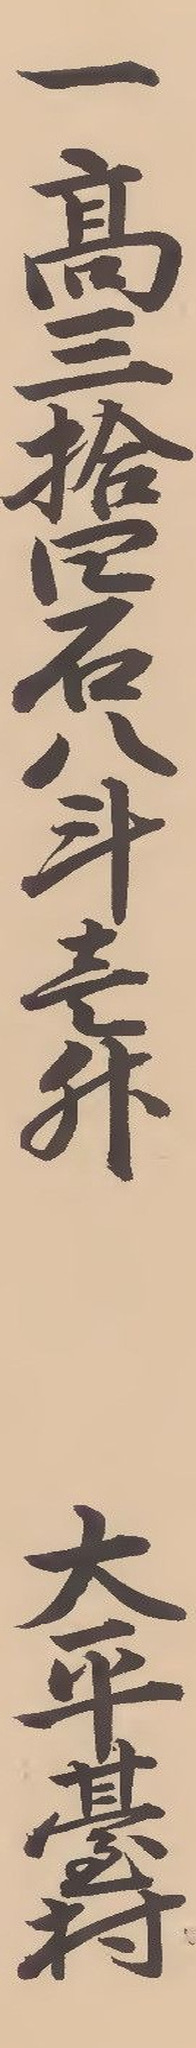一高三拾四石八斗壱升大平台村
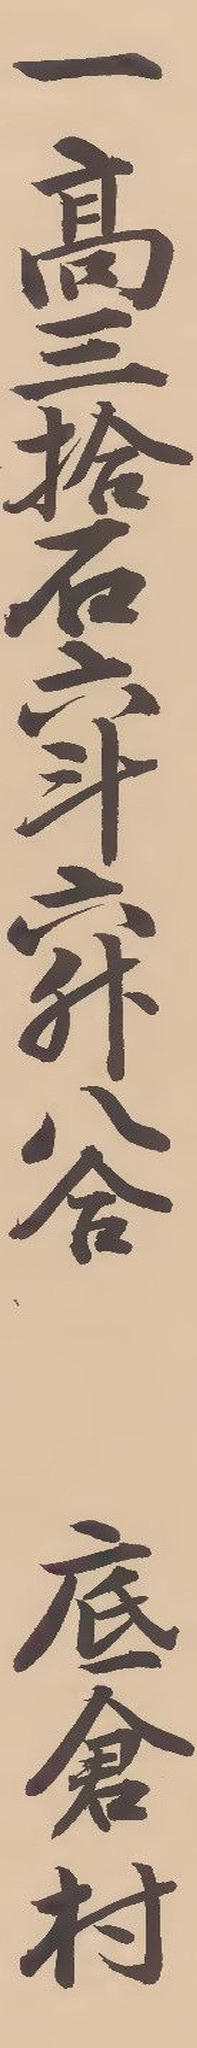一高三拾石六斗六升八合底倉村
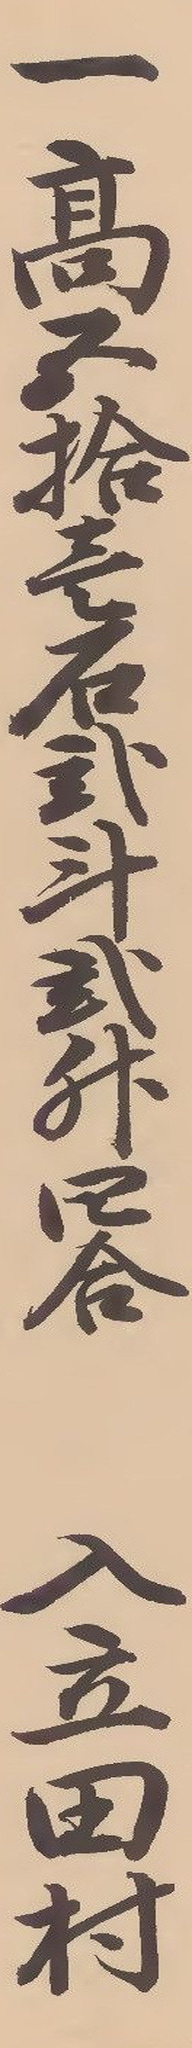一高五拾壱石弐斗弐升四合入立田村

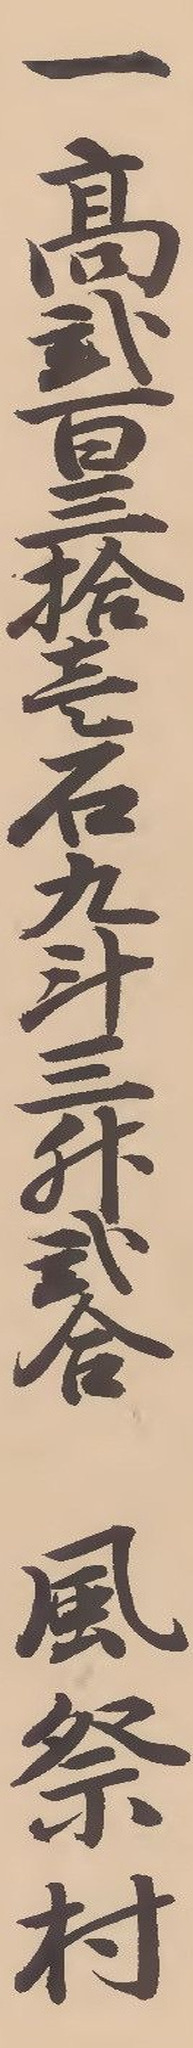一高弐百三拾壱石九斗三升弐合風祭村
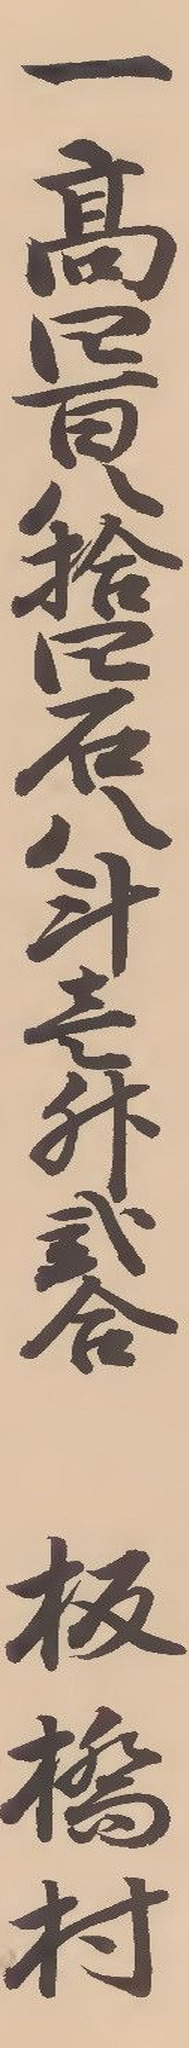一高四百八拾四石八斗壱升弐合板橋村
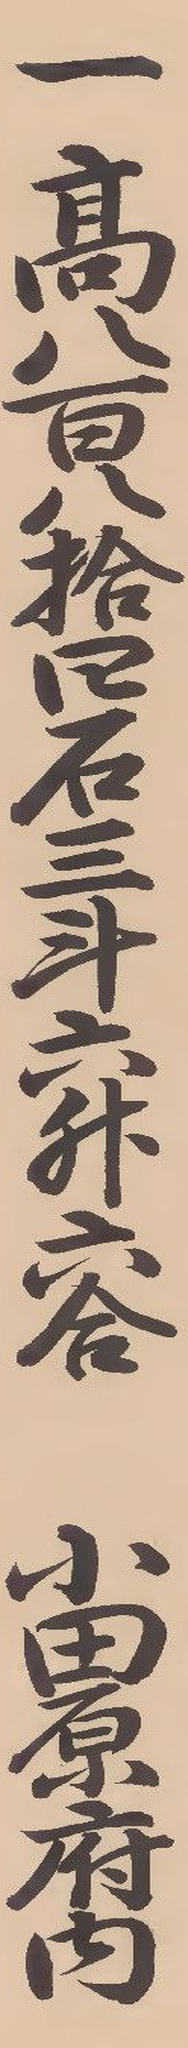一高八百八拾四石三斗六升六合小田原府内
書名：相模国郷帳
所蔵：国立公文書館 National Archives of Japan
